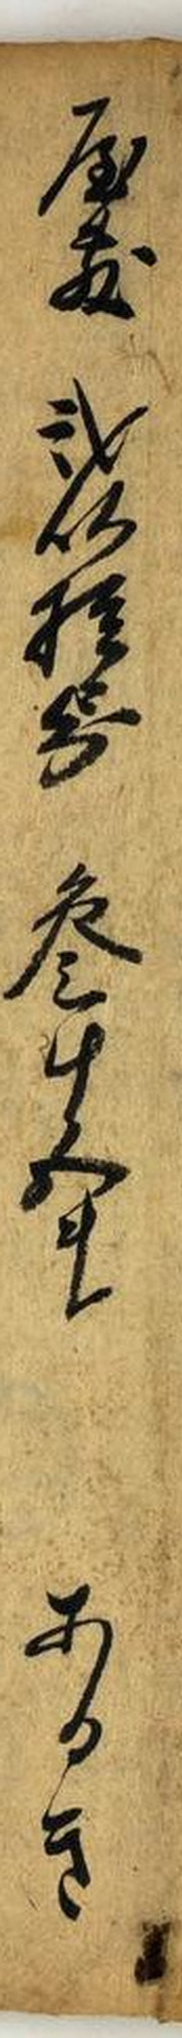屋敷弐畝拾歩参斗五升おかき
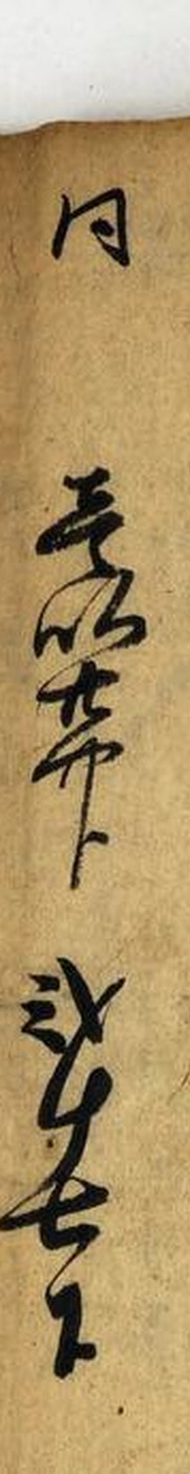同壱畝廿四分弐斗七升藤四郎
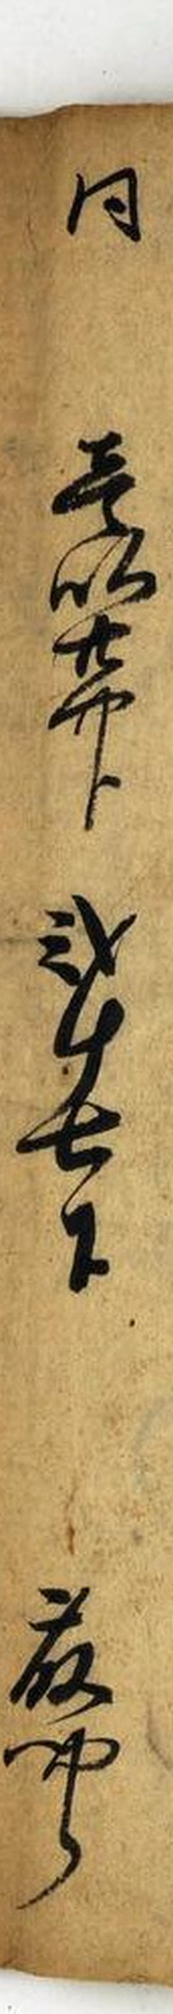同壱畝廿四分弐斗七升藤四郎
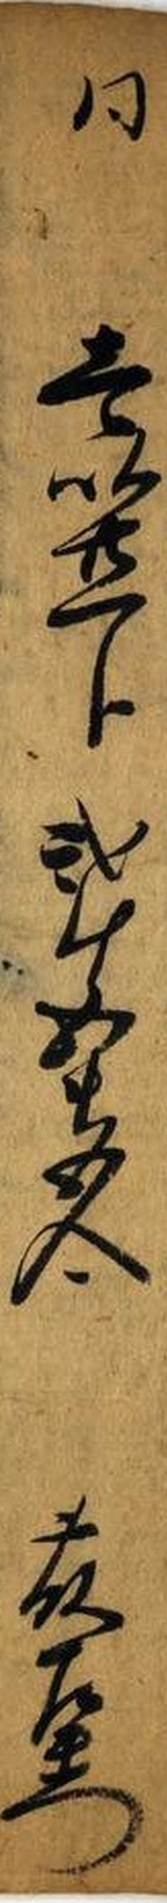同壱畝廿一分弐斗五升五合藤左衛門
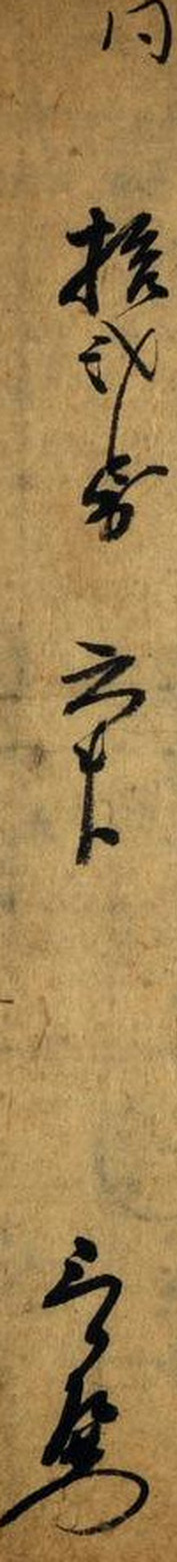同拾弐歩六升三郎左衛門
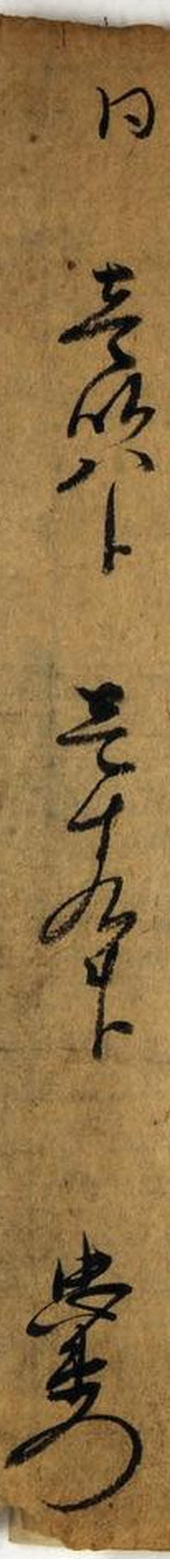同壱畝八分壱斗九升忠右衛門

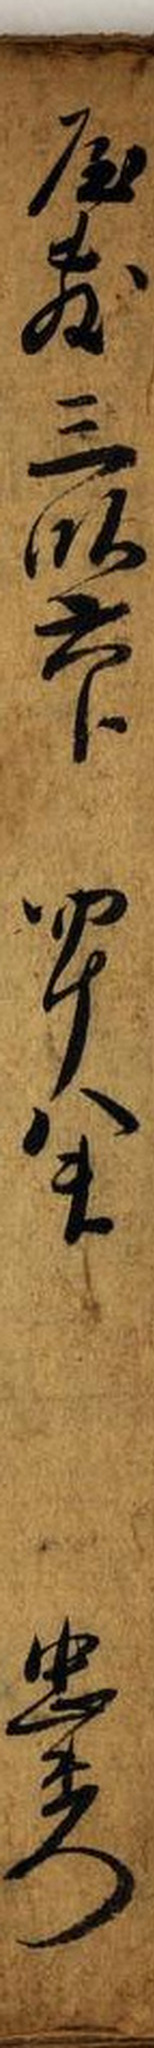屋敷三畝六分四斗八升忠左衛門
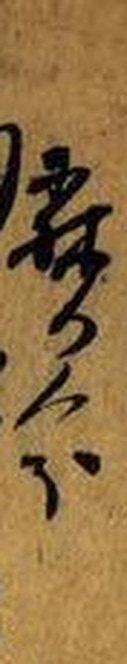森かく分
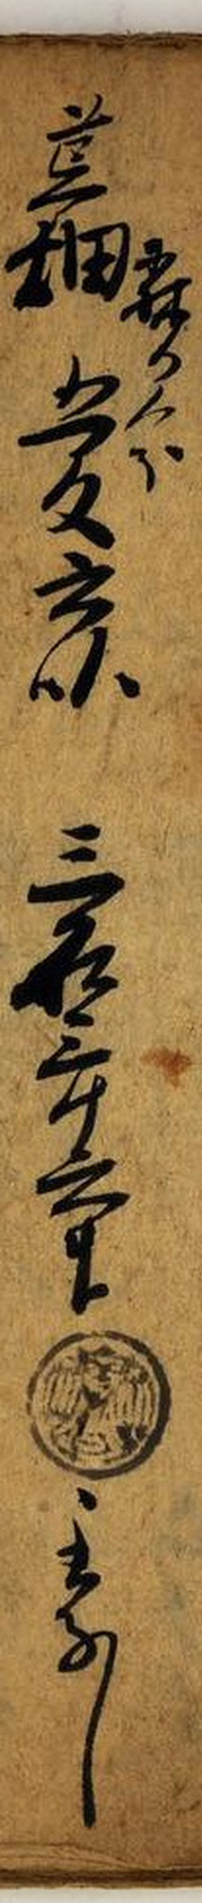荒畑五反六畝三石三斗六升㊞主なし
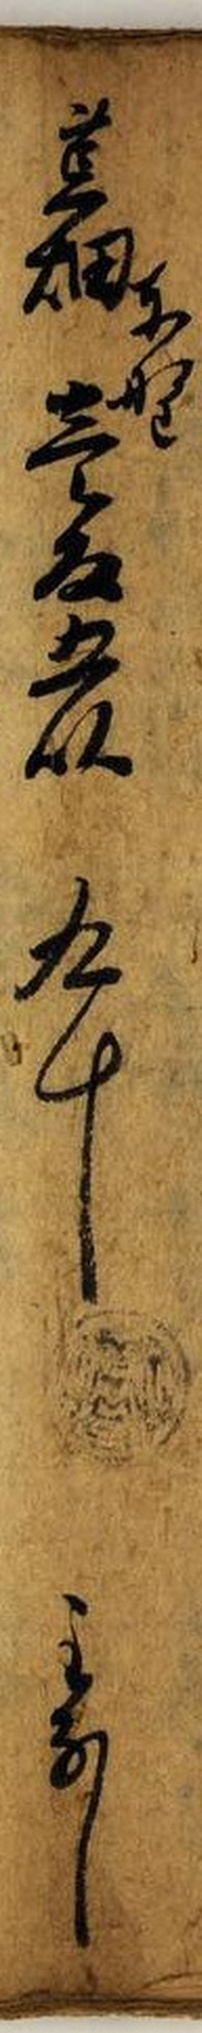荒畑壱反五畝九斗㊞主なし
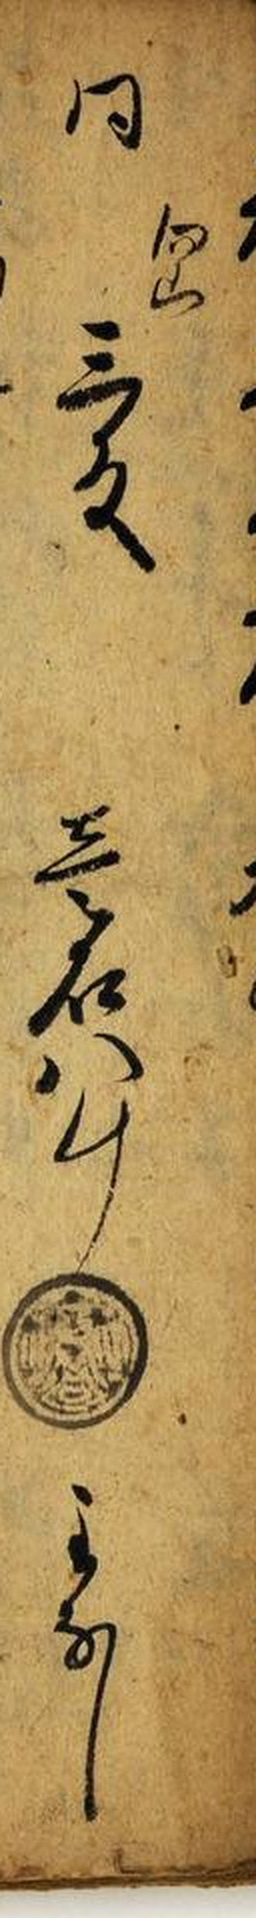同三反壱石八斗㊞主なし
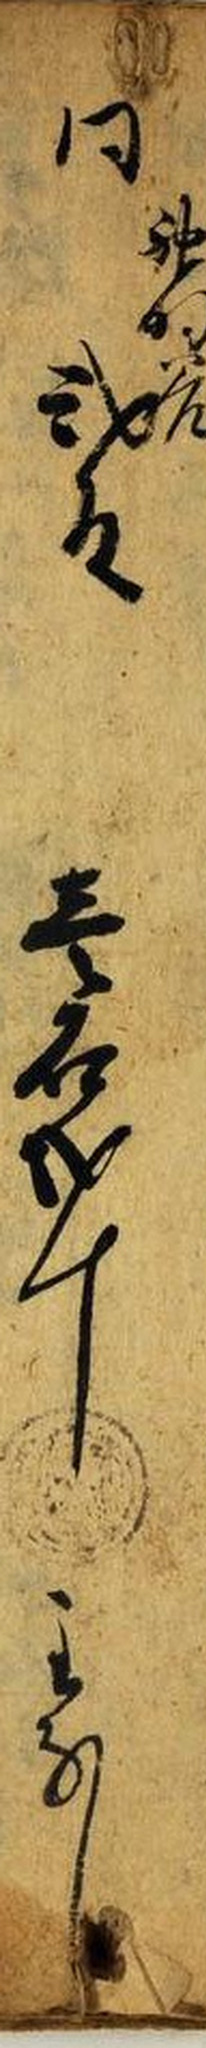同弐反壱石弐斗㊞主なし
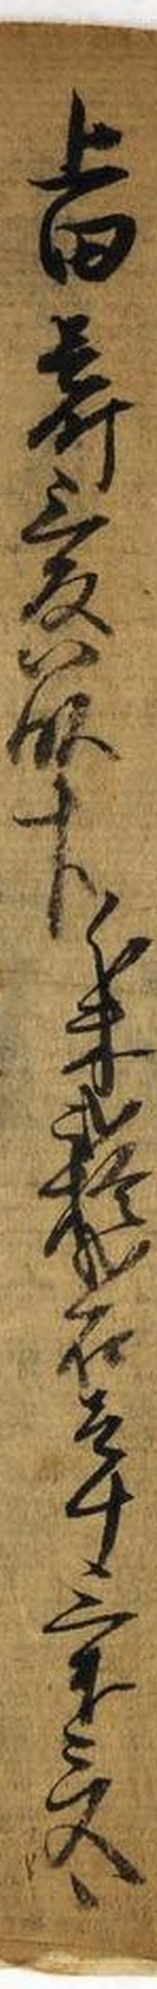上田壱町三反八畝十分分米弐拾弐石壱斗三升三合
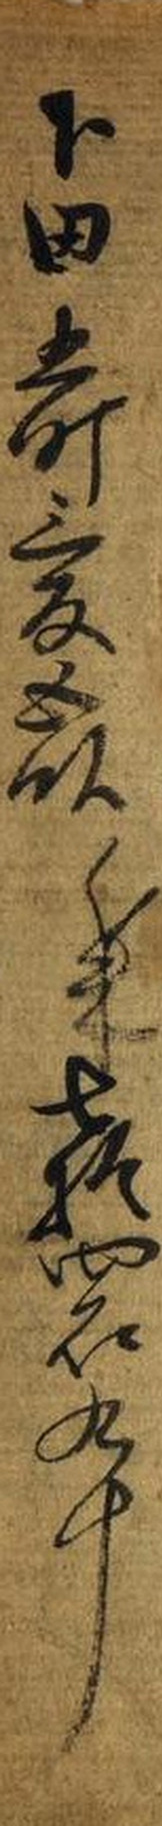下田五町三反五畝分米七拾四石九斗
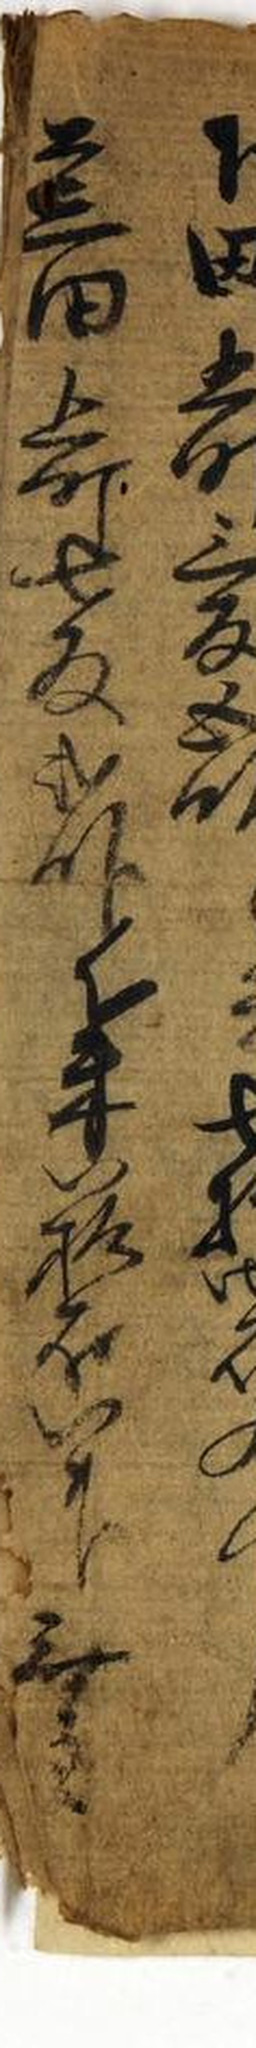荒田五町七反弐畝分米八拾石八升無主無

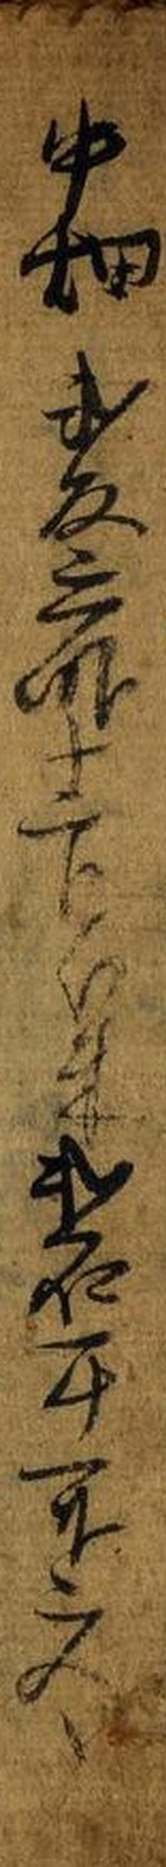中畑弐反六畝十二分分米弐石一斗一升二合
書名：越前国西方内志津庄内本折村御検地帳
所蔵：福井県文書館 Fukui Prefectural Archives
